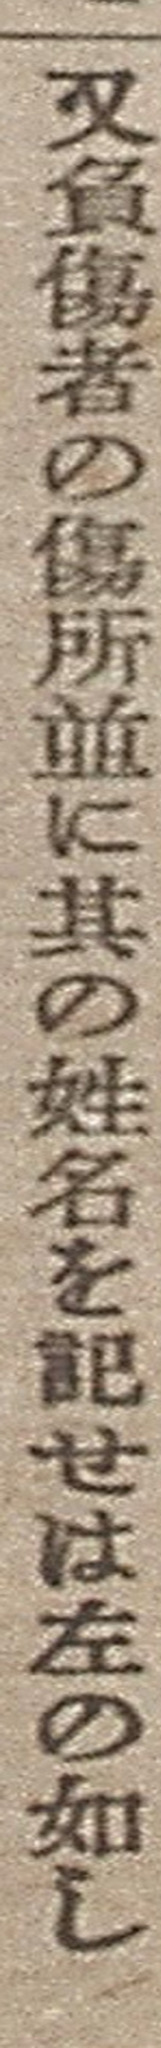又負傷者の傷所並に其の姓名を記せは左の如し
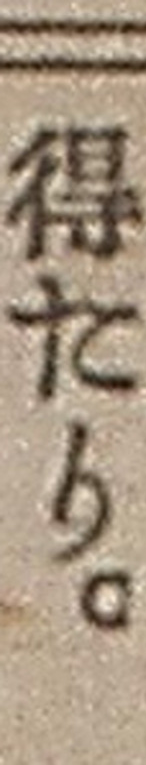得たり。
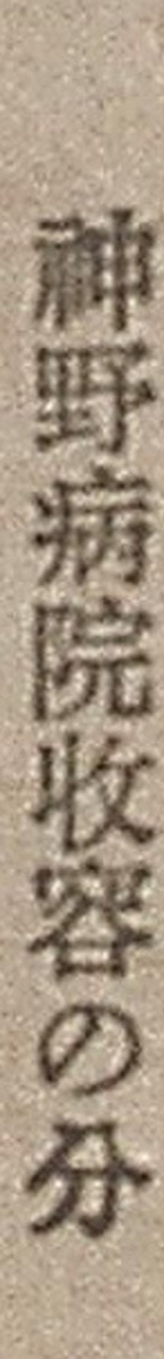神野病院収容の分
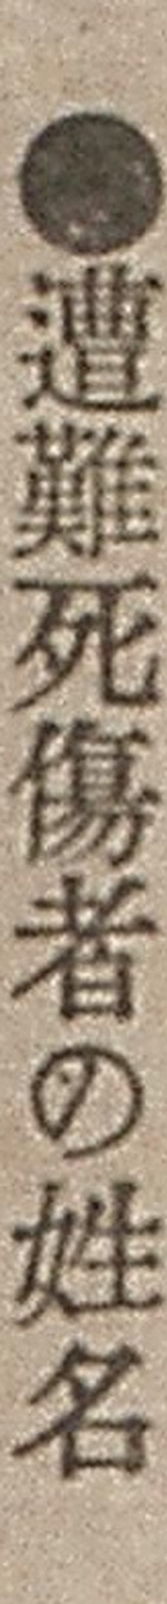●遭難死傷者の姓名
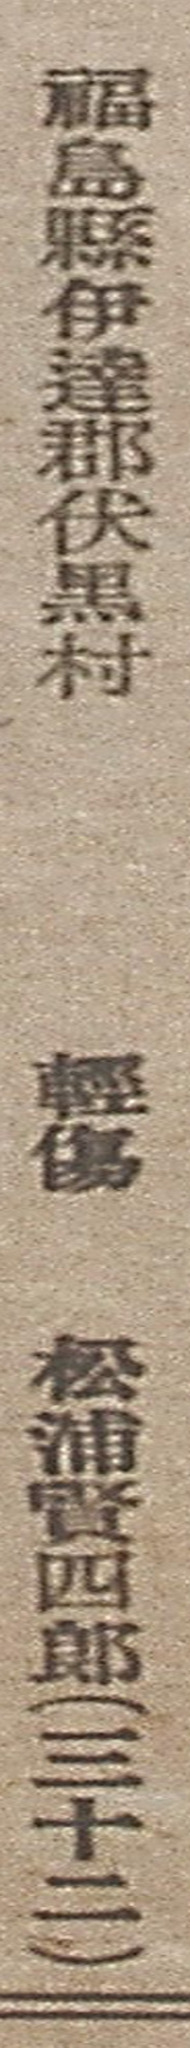福島県伊達郡伏黒村軽傷松浦賢四郎
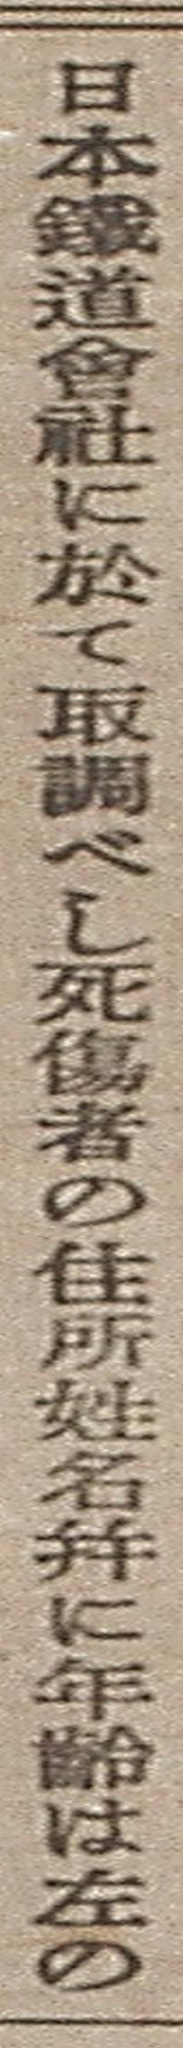日本鉄道会社に於て取調べし死傷者の住所姓名并に年齢は左の
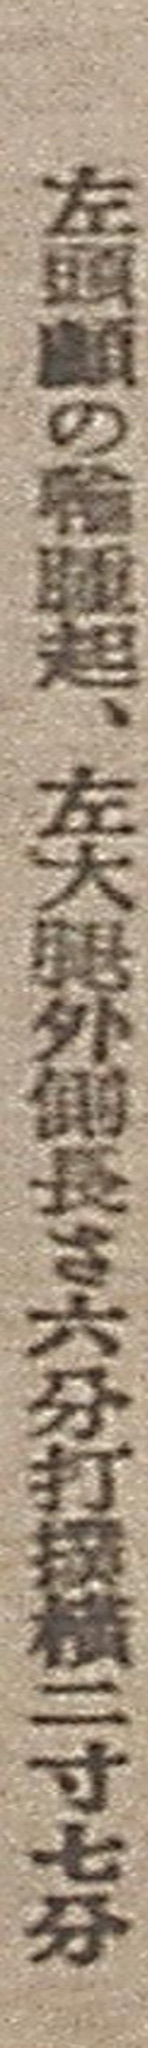左頭顱の輪腫起、左大腿外側長さ六分打撲横二寸七分
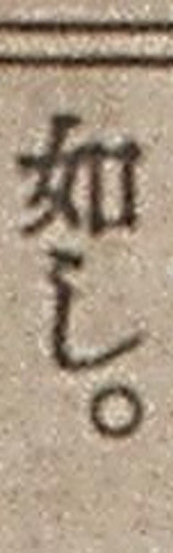如し。
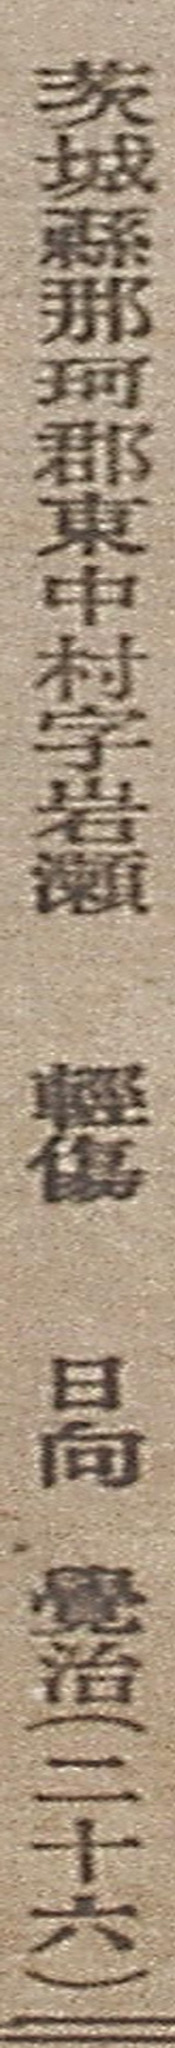茨城県那珂郡東中村字岩瀬軽傷日向覺治
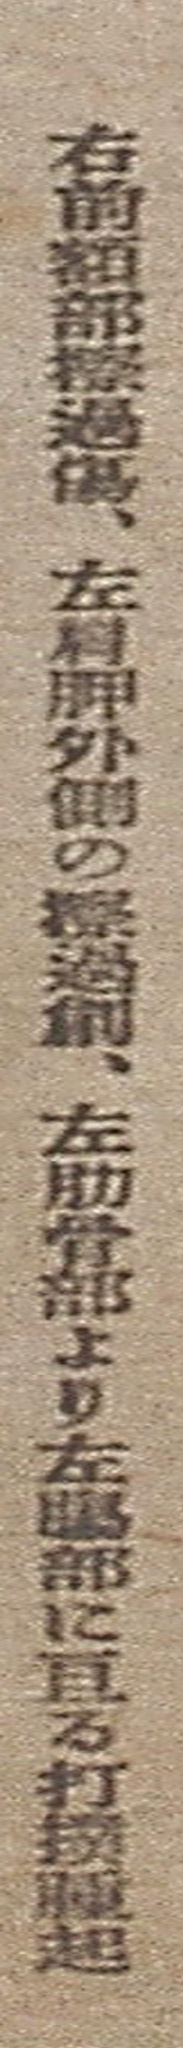右前額部擦過傷、左肩胛外側の擦過創、左肋骨部より左腹部に亘る打撲腫起
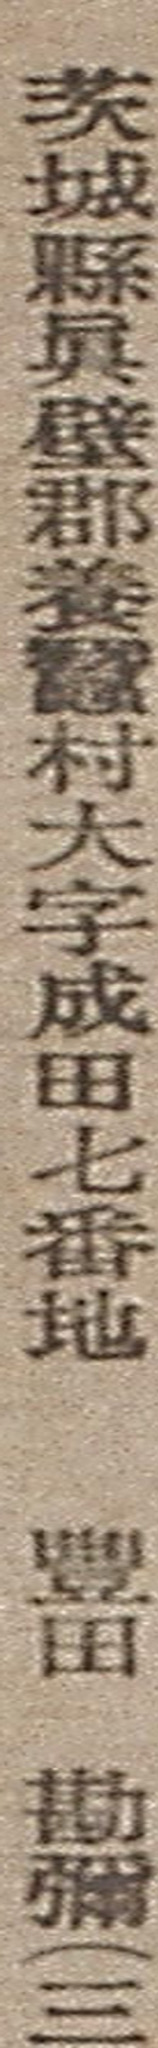茨城県真壁郡養蚕村大字成田七番地豊田勘彌
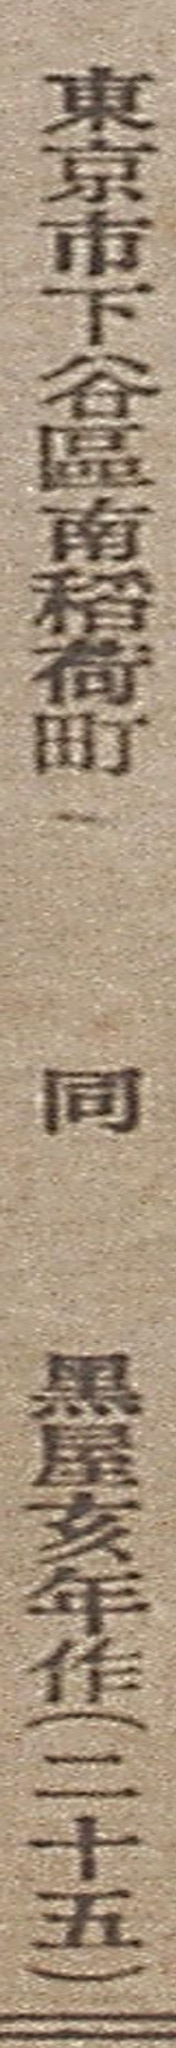東京市下谷区南稲荷町同黒屋亥年作
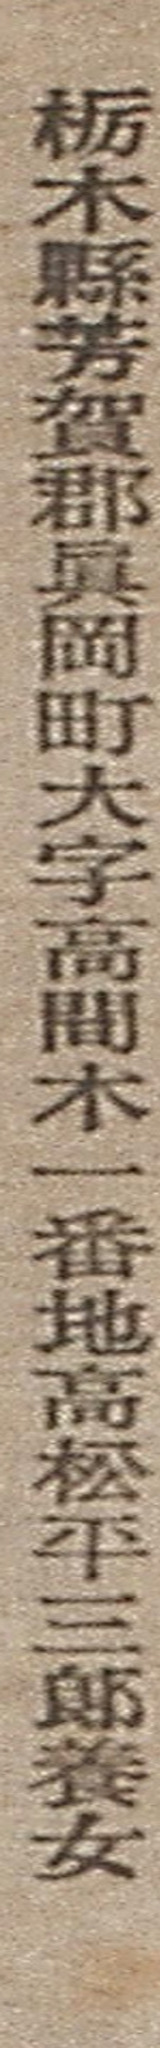栃木県芳賀郡真岡町大字高間木一番地高松平三郎養女
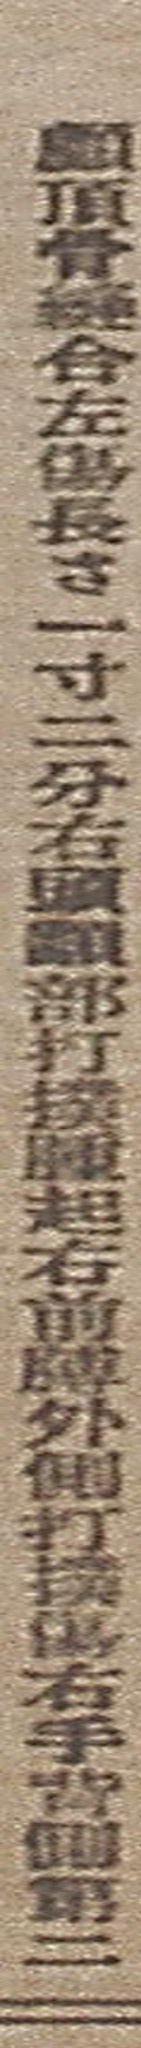顱頂骨縫合左傷長さ一寸二分右頭顱部打撲腫起右前膊外側打撲傷右手背側第二
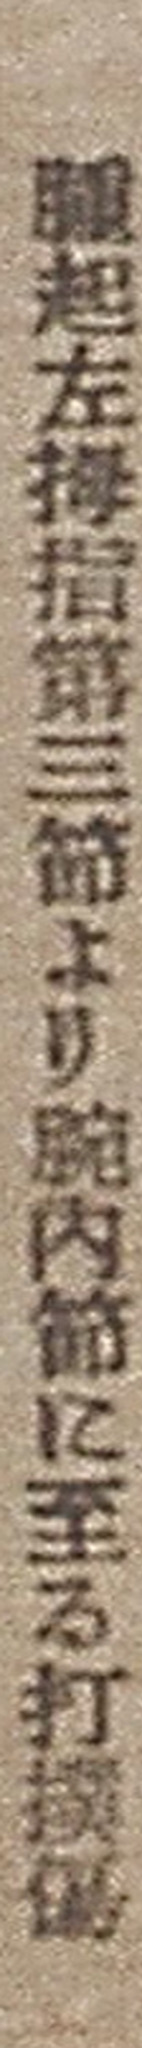腫起左拇指第三節より腕内節に至る打撲傷
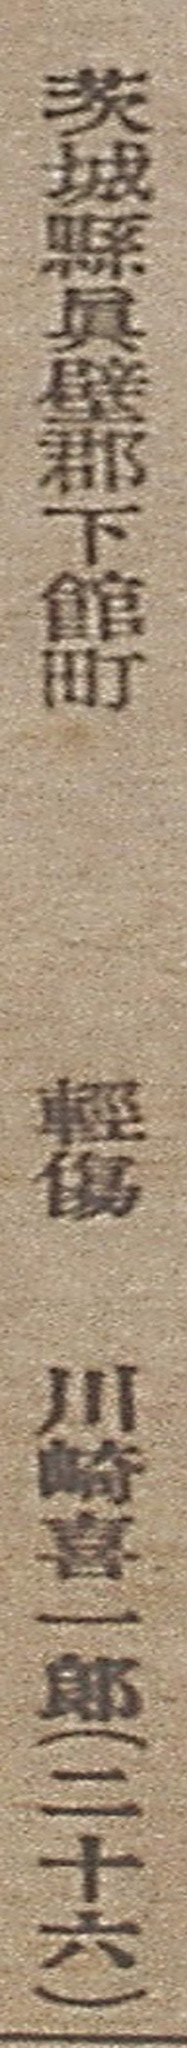茨城県真壁郡下館町軽傷川崎喜一郎
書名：風俗畫報臨時増刊第百九十九號　明治三十二年十月各地災害圖會（前編之續）
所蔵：東京大学地震研究所図書室 Earthquake Research Institute Library, The University of Tokyo, JAPAN
